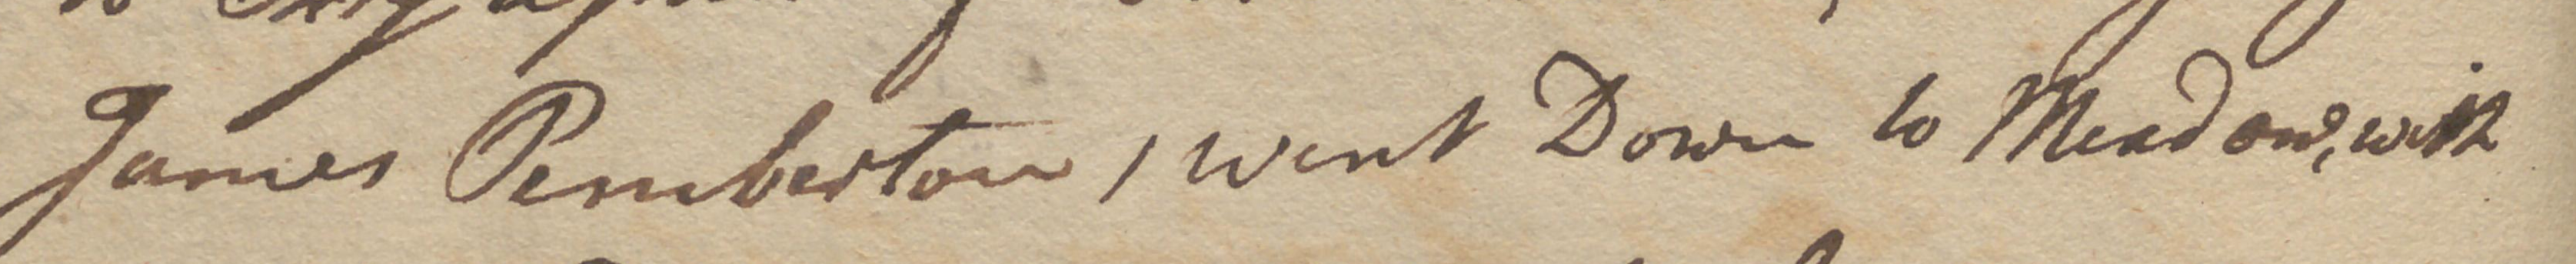James Pemberton, went Down to Meadow, with
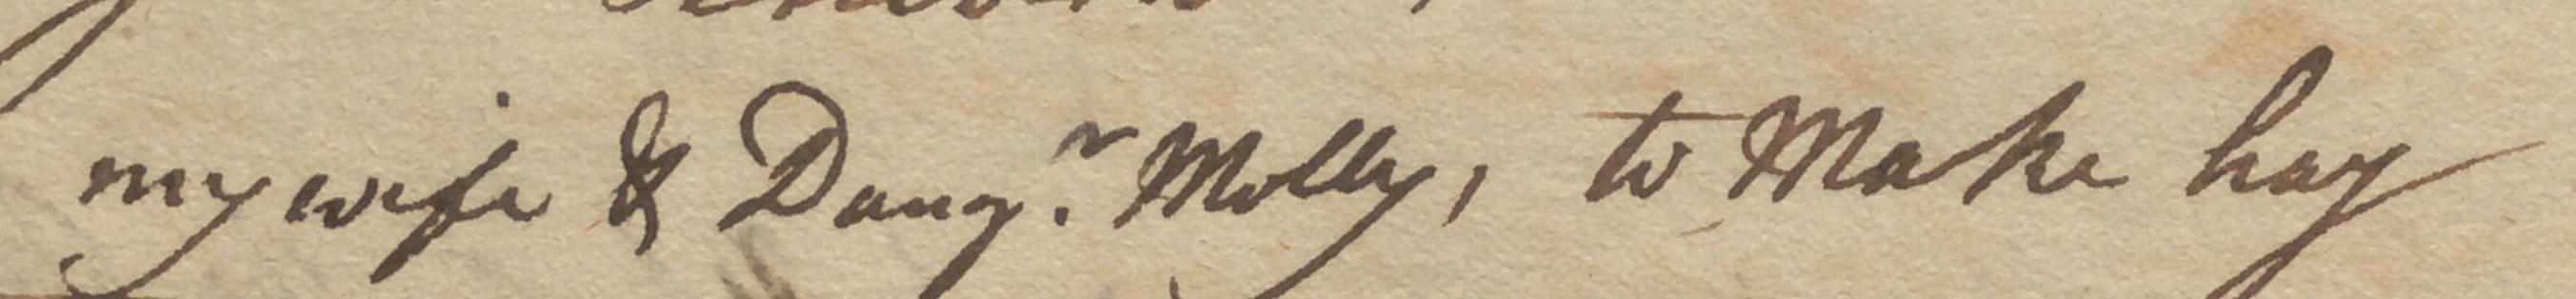my wife & Daug^r. Molly, to Make hay
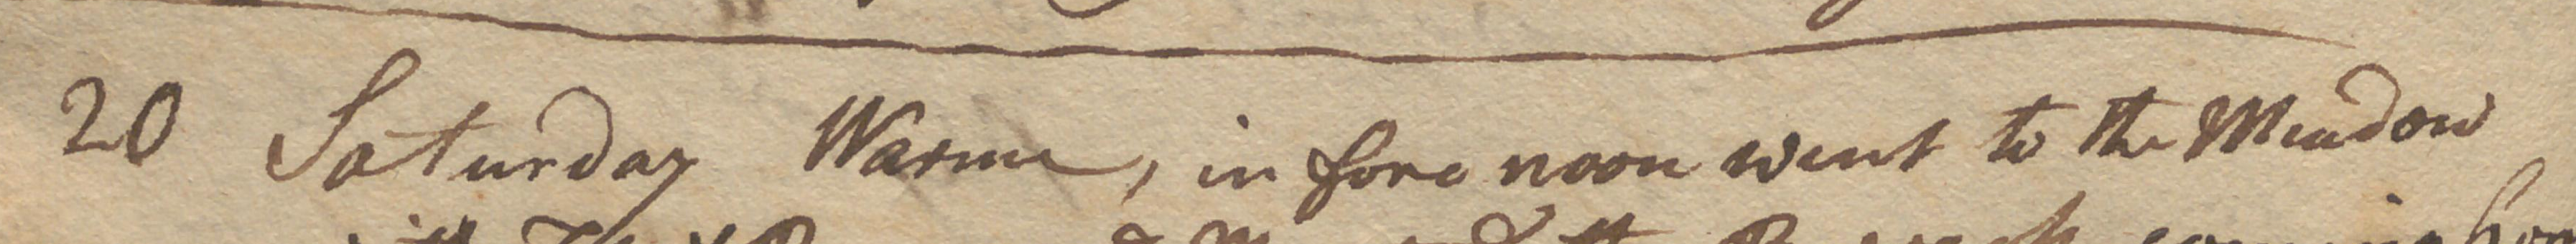20 Saturday Warme, in forenoon went to the Meadow
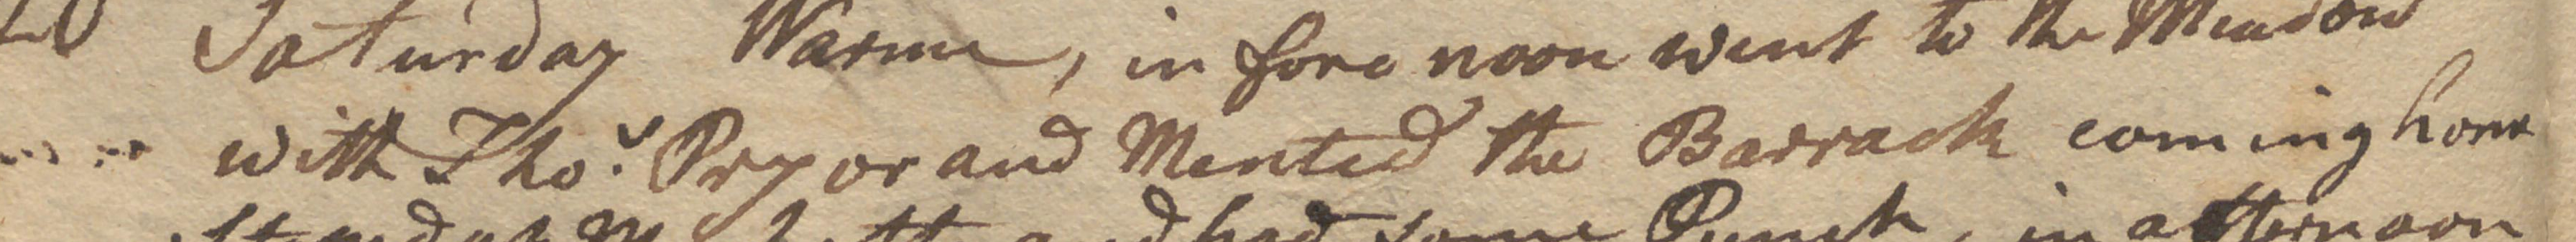with Tho^s. Pryor and Mented the Barrock coming home
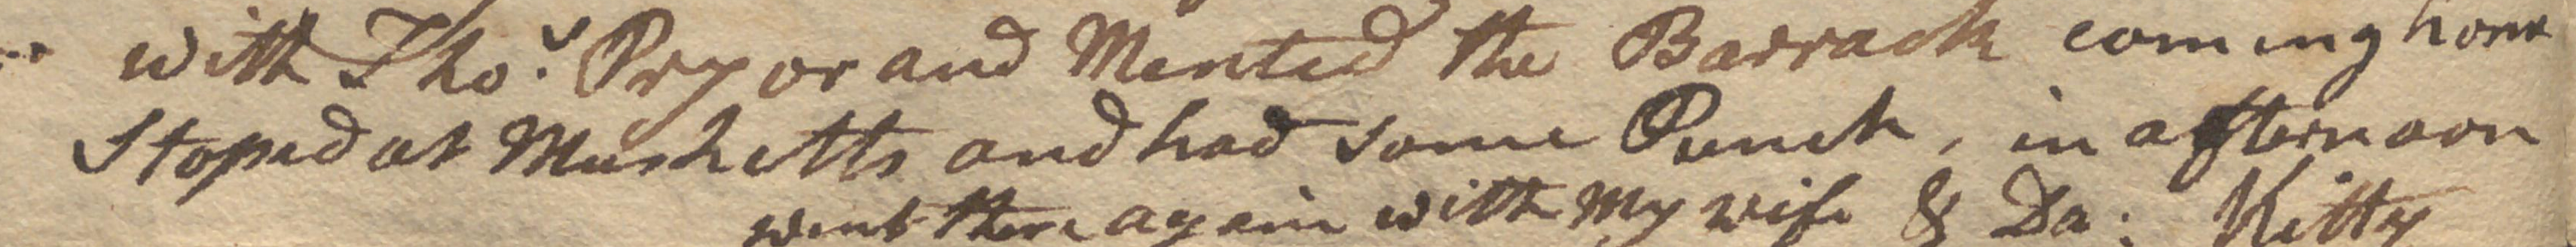Stoped at Mushetts and had some Punch, in afternoon
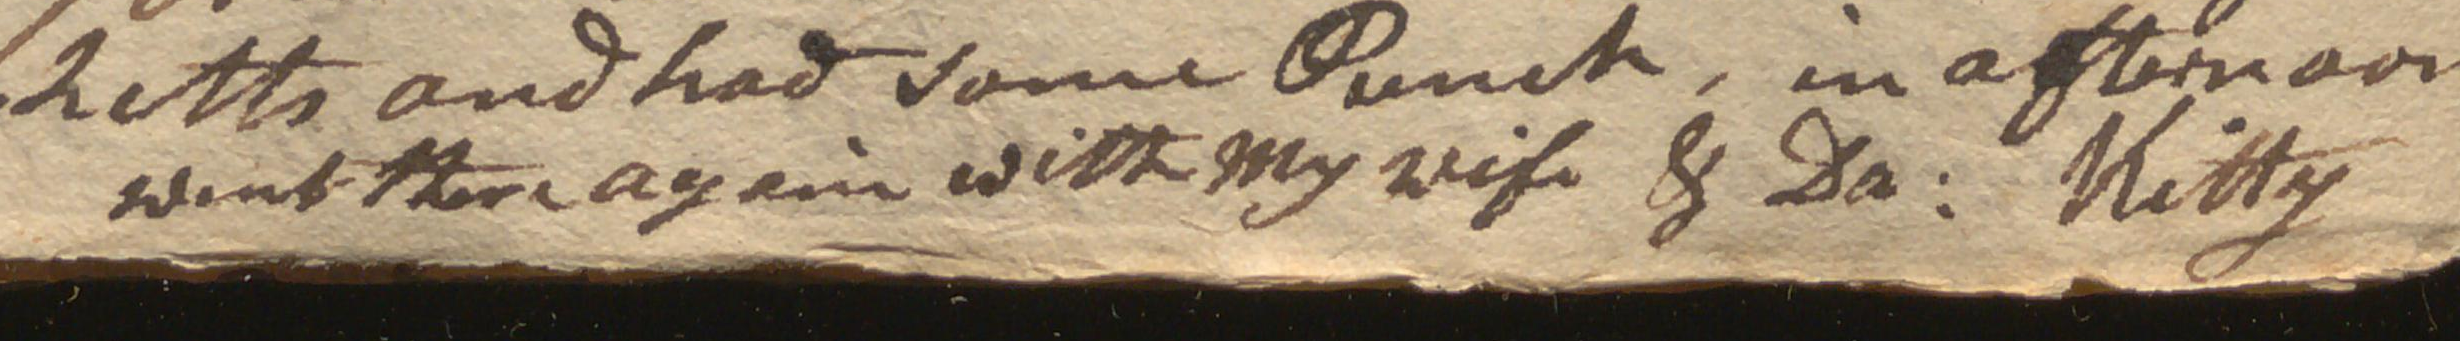went there again with my wife & Da: Kitty
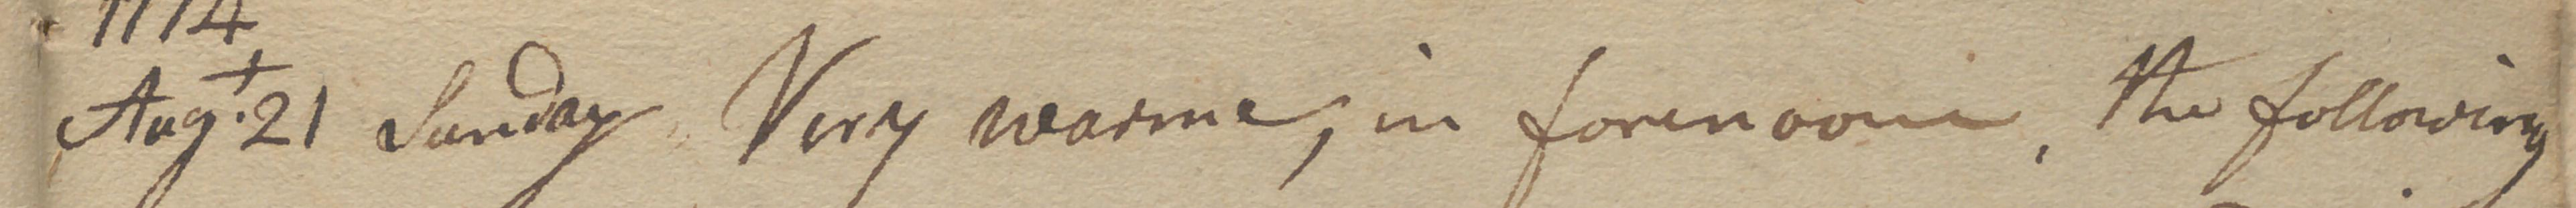Aug^t. 21 Sunday Very warme, in forenoon the following
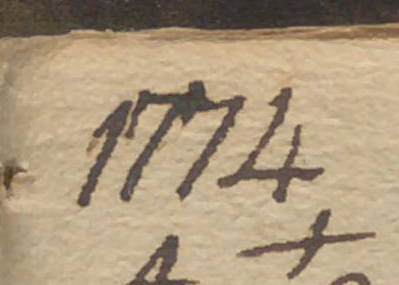1774
